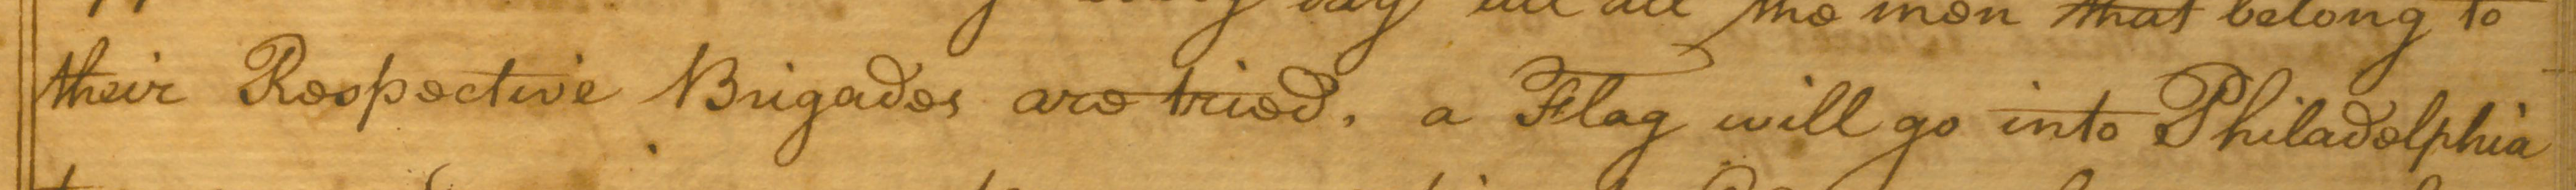their Respective Brigades are tried. a Flag will go into Philadelphia
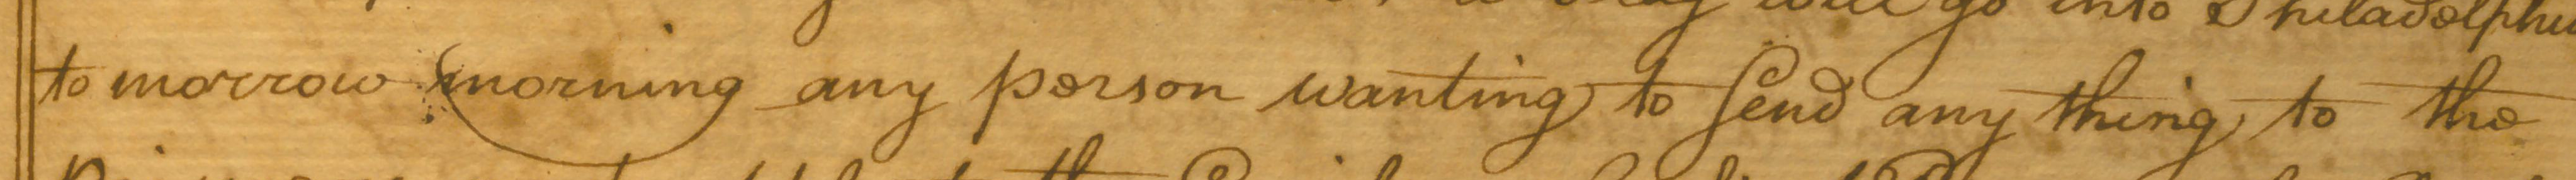tomorrow morning any person wanting to send any thing to the
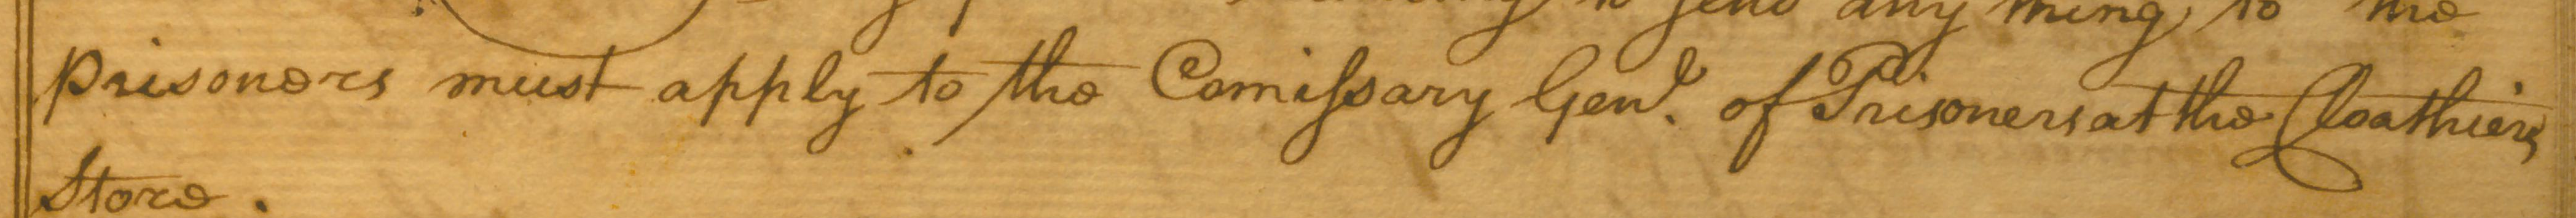prisoners must apply to the Comissary Gen^l. of Prisoners at the Cloathiers
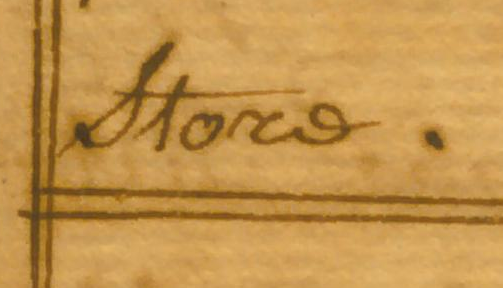Store.
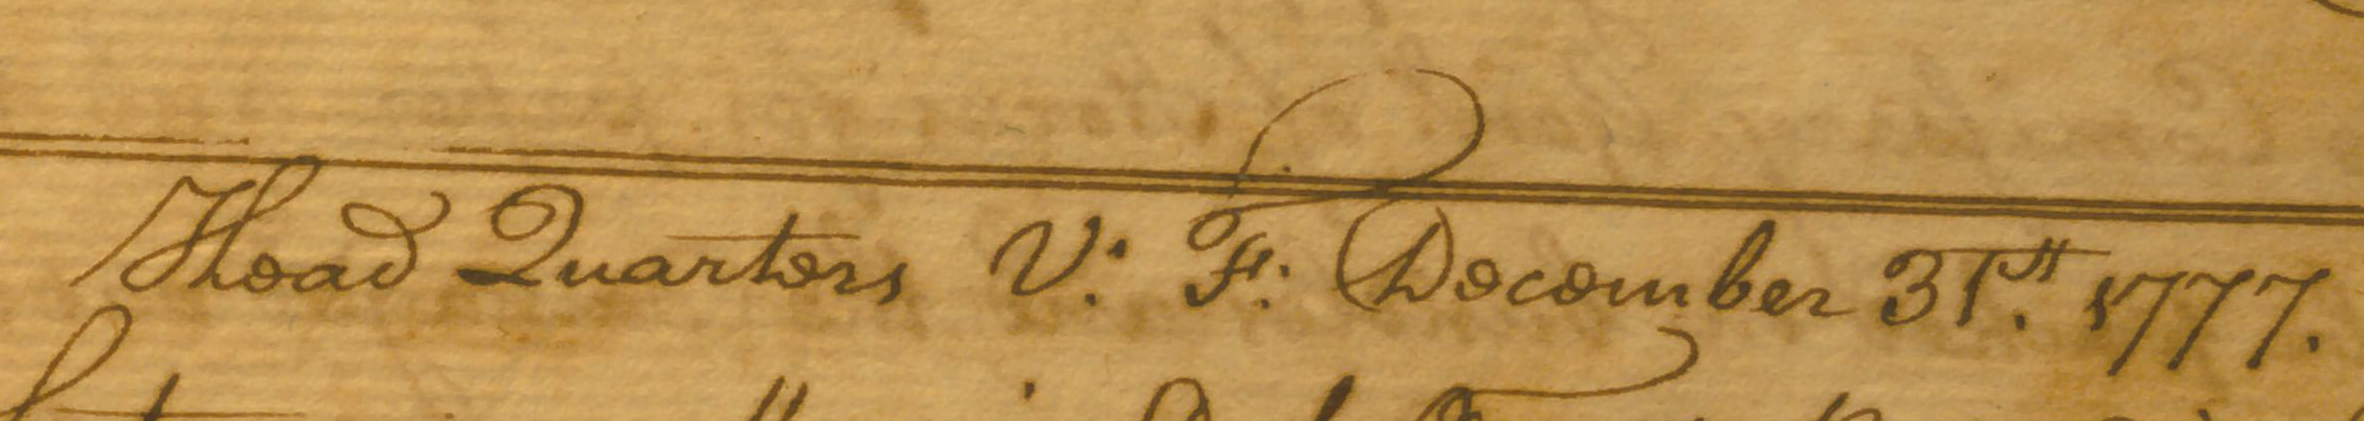Head Quarters V: F: December 31^st. 1777.
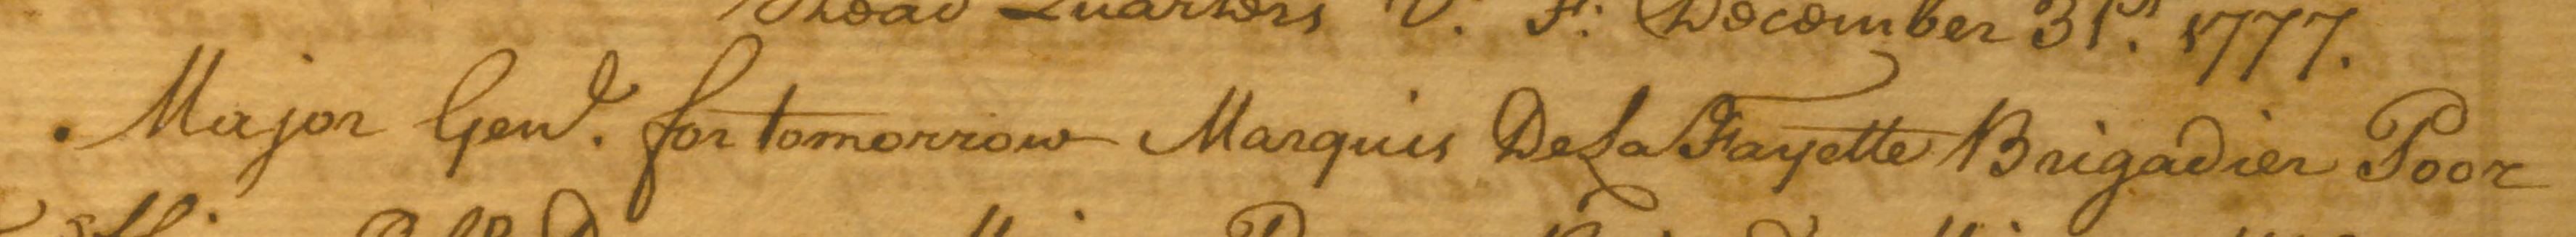Major Gen^l. for tomorrow Marquis De La Fayette Brigadier Poor
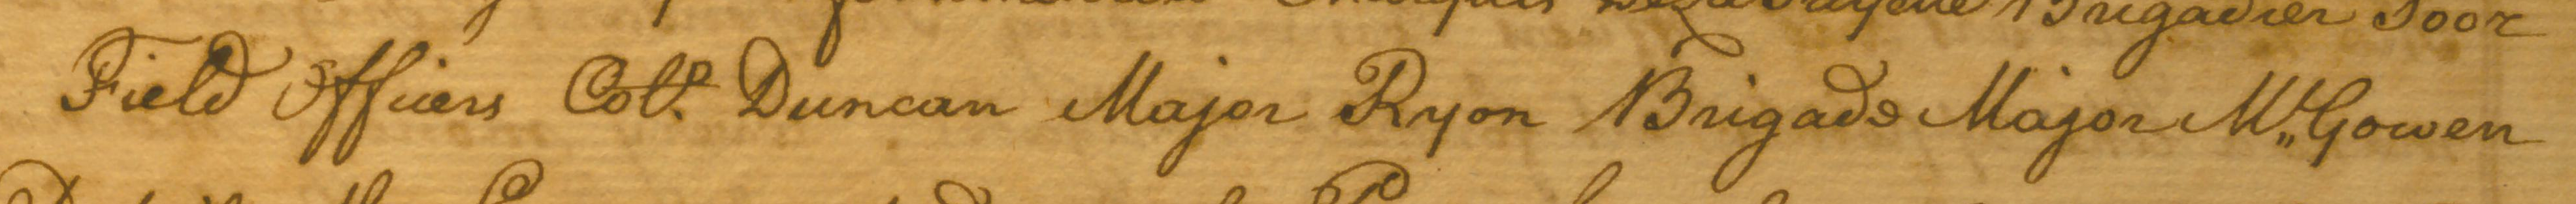Field Officers Col^o. Duncan Major Ryan Brigade Major M^c.Gowan
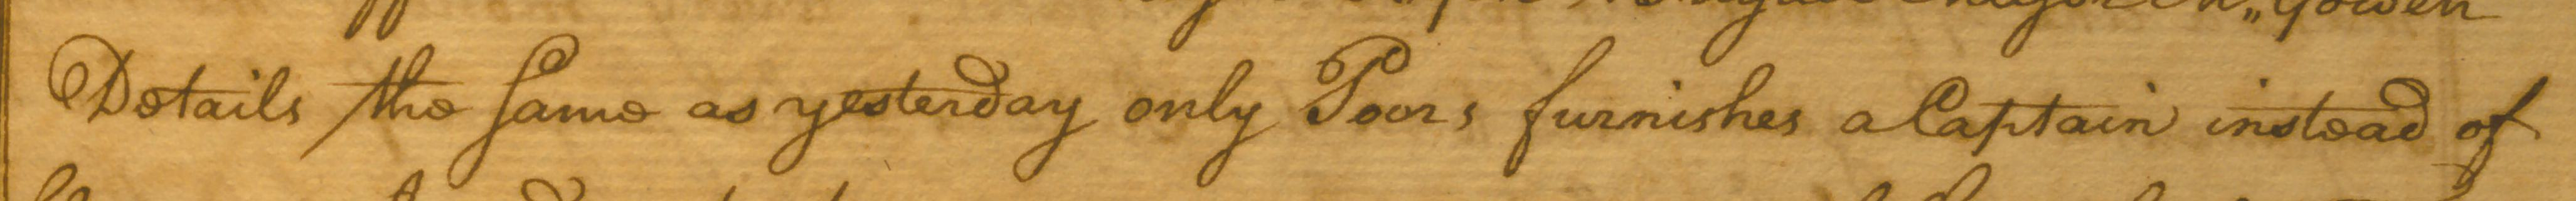Details the same as yesterday only Poors furnishes a Captain instead of
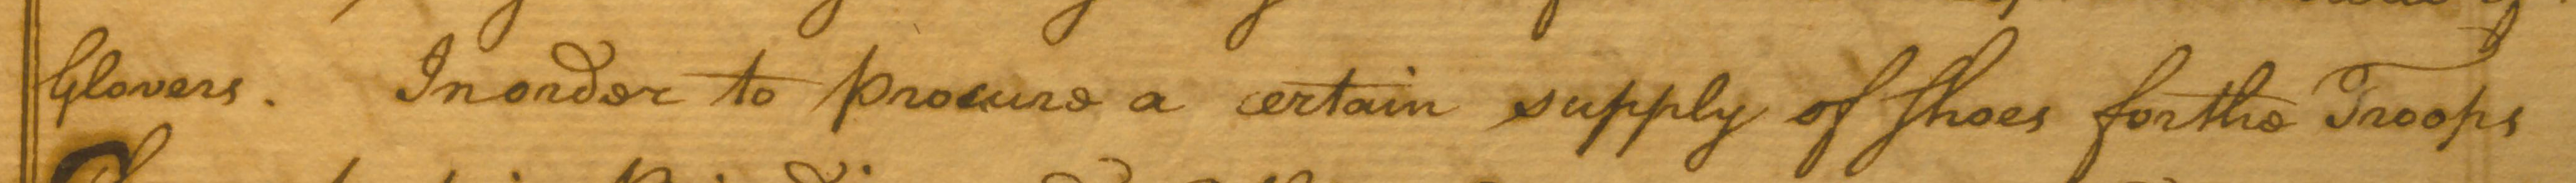Glovers. In order to procure a certain supply of shoes for the Troops
